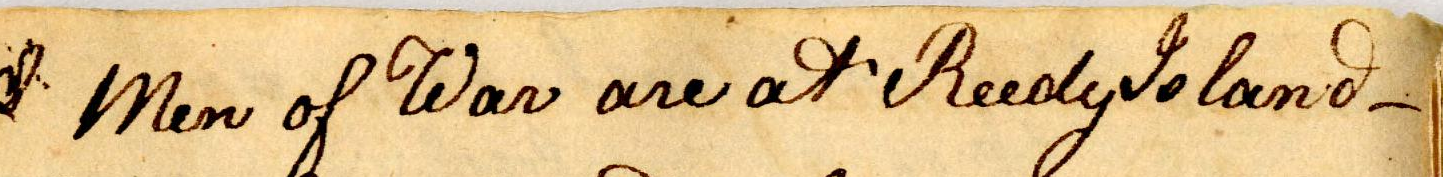Men of War are at Reedy Island-
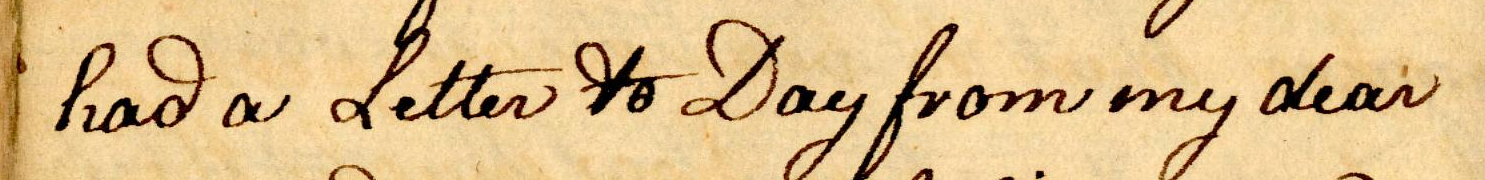had a Letter to Day from my dear
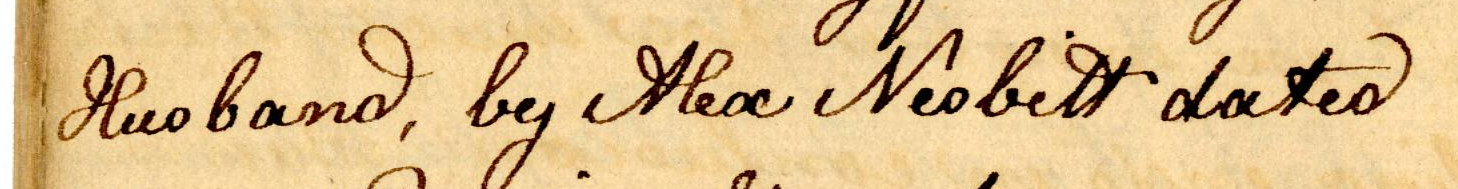Husband, by Alex Nesbitt dated
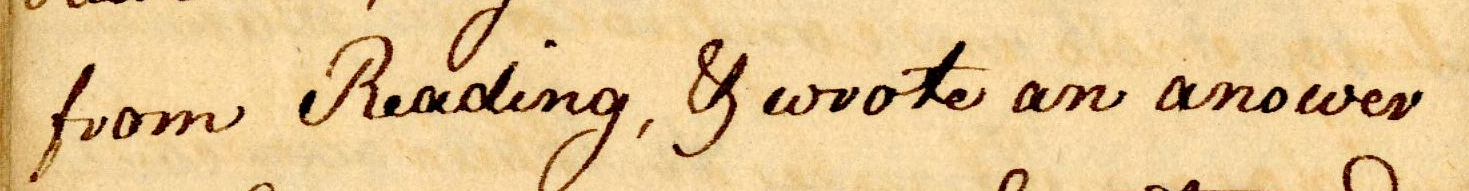from Reading, & wrote an answer
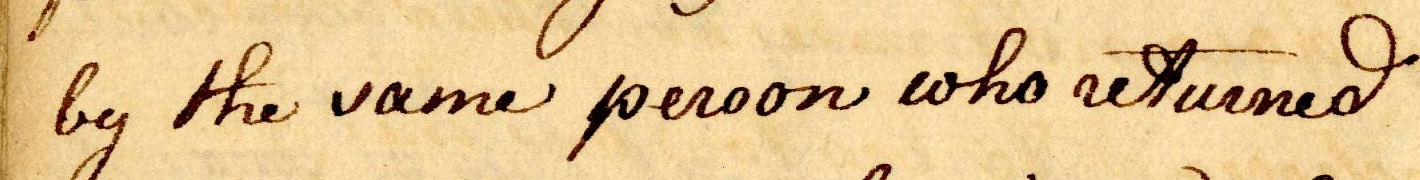by the same person who returned
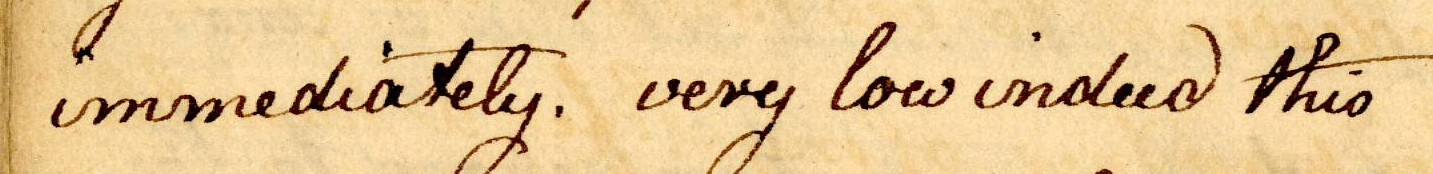immediately. very low indeed this
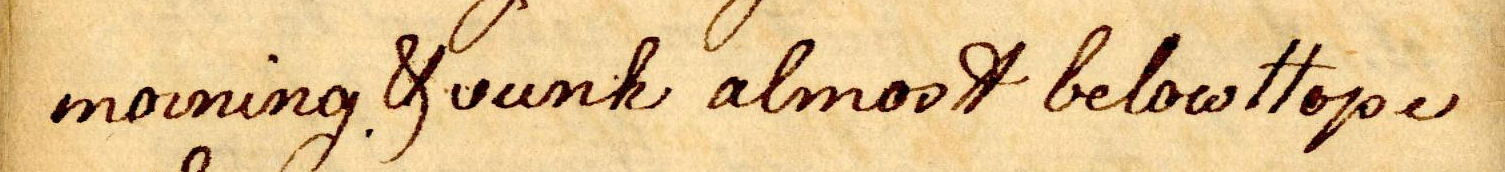morning & sunk almost below Hope
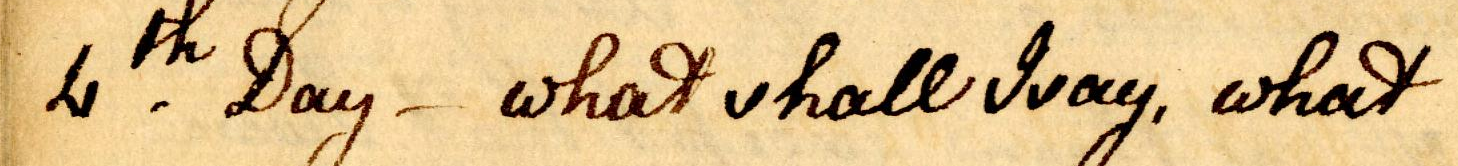4^th. Day- what shall I say, what
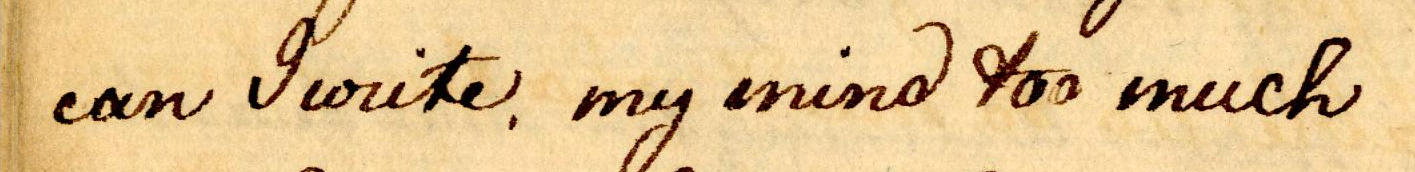can I write, my mind too much
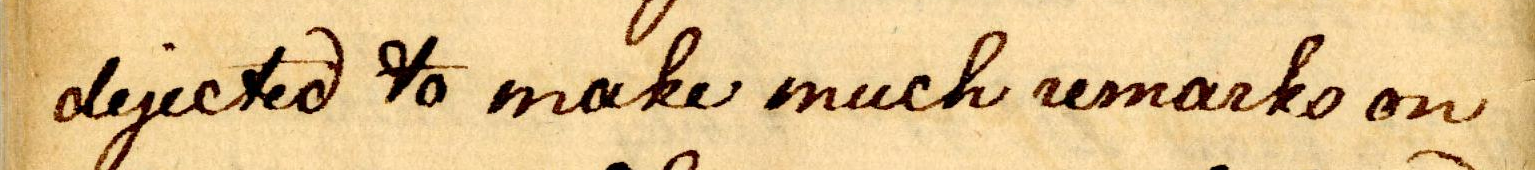dejected to make much remarks on
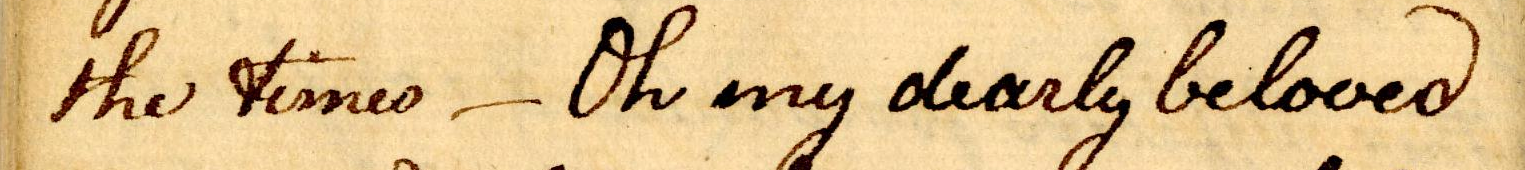the times- Oh my dearly beloved
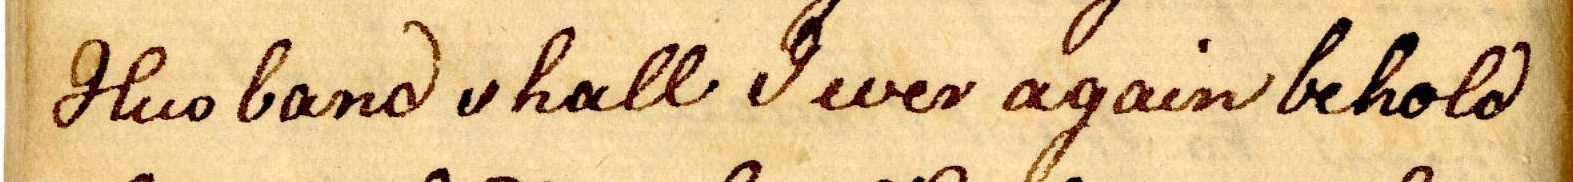Husband shall I ever again behold
